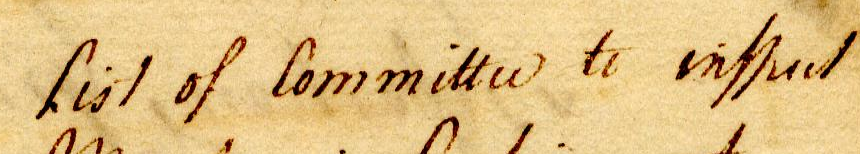List of Committee to inspect
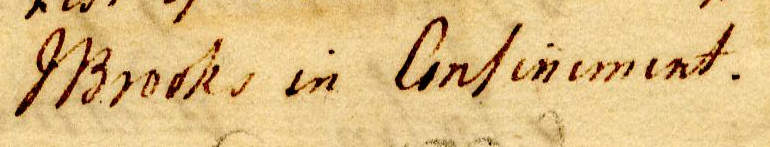J. Brooks in Confinement.
